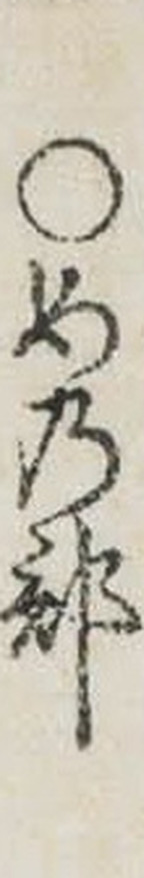○めの部
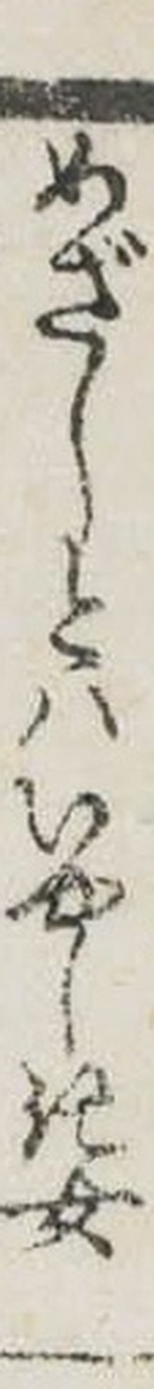めざしとはいやしき女
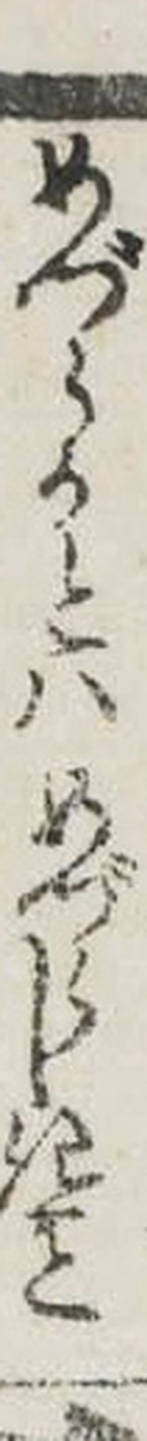めづらかとはめづらしきこと
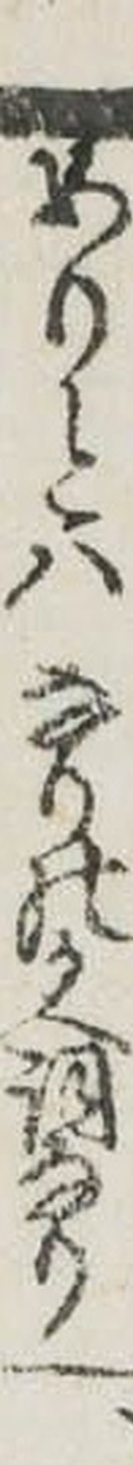めりとはなりのかへ詞なり
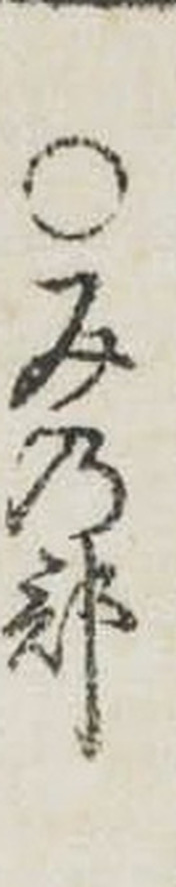○みの部
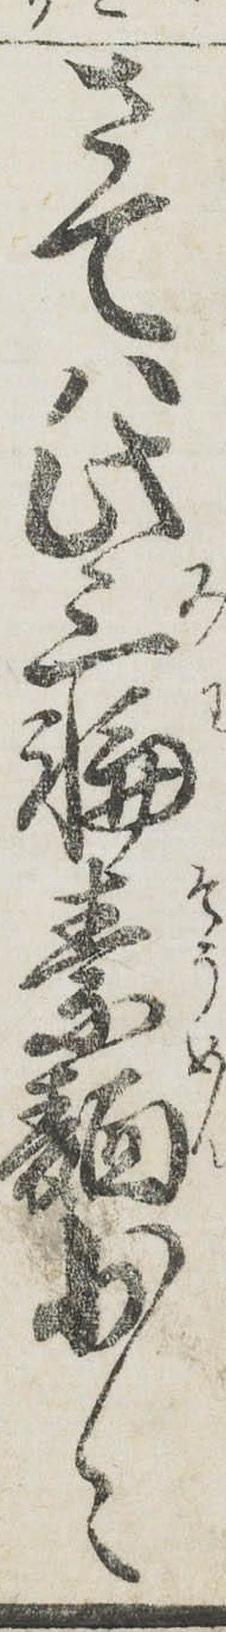さては此三輪素麵少々
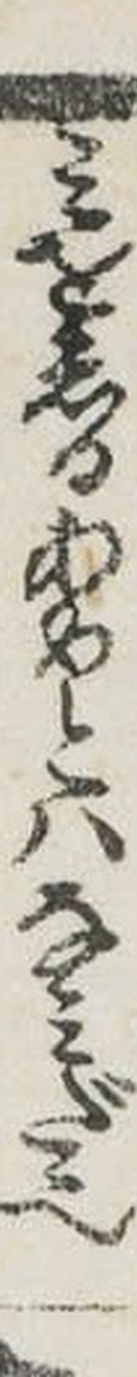みをしるあめとはなみだ也
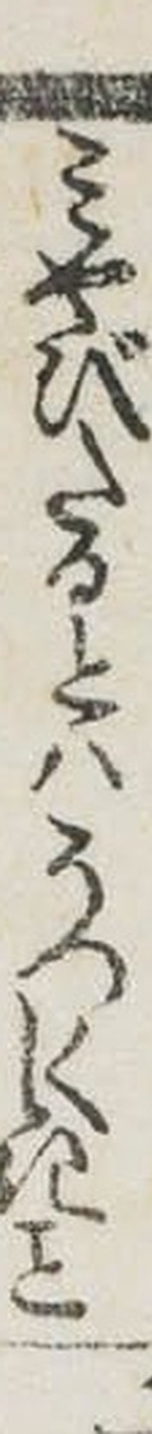みやびたるとはうつくしきこと
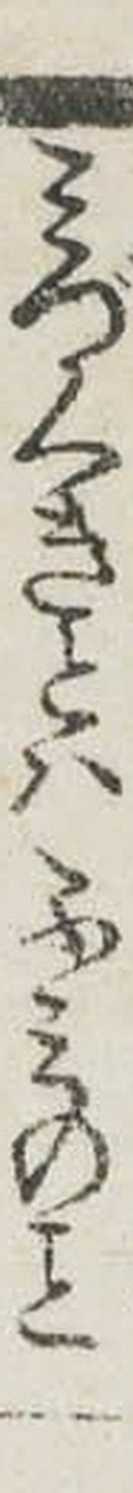みづくきとはふみのこと
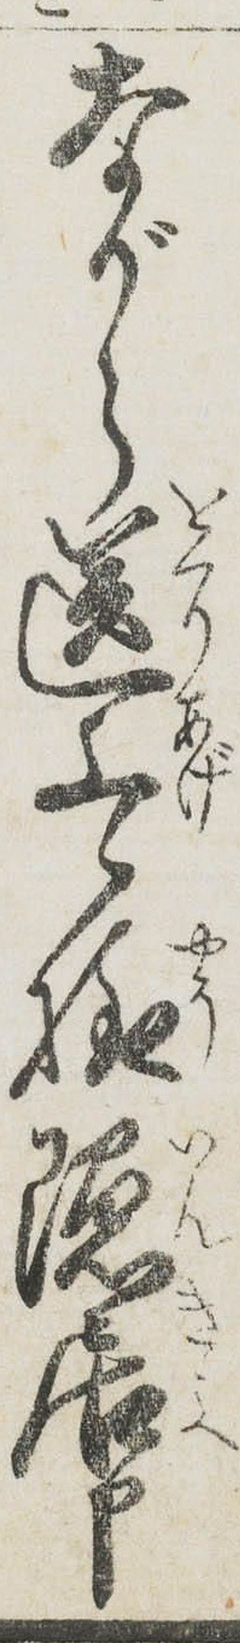ながら送上候様隠居申
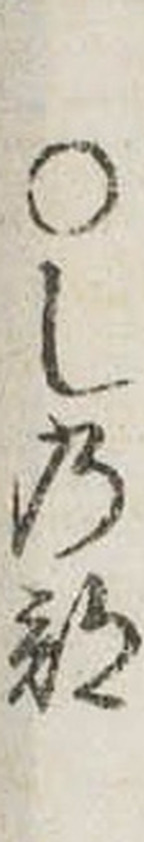○しの部
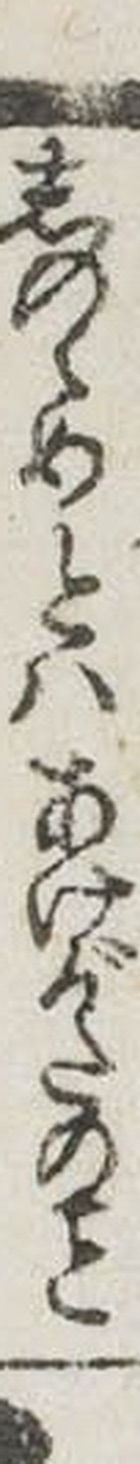しのゝのめとはあけがたのこと
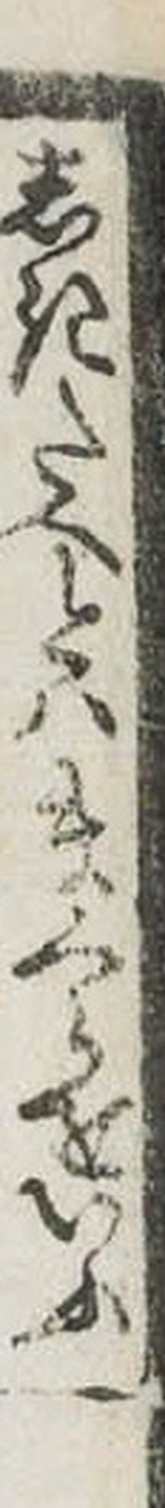しきたへとはまくらをいふ
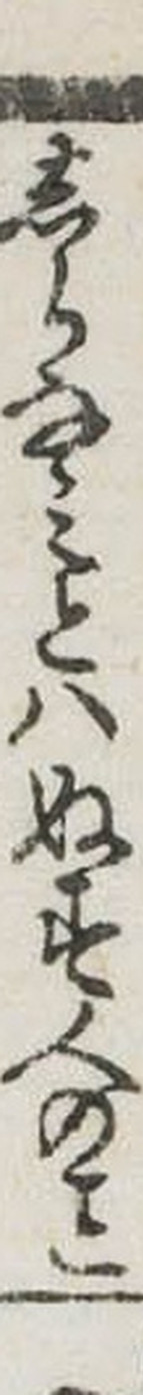しらなみとはぬす人のこと
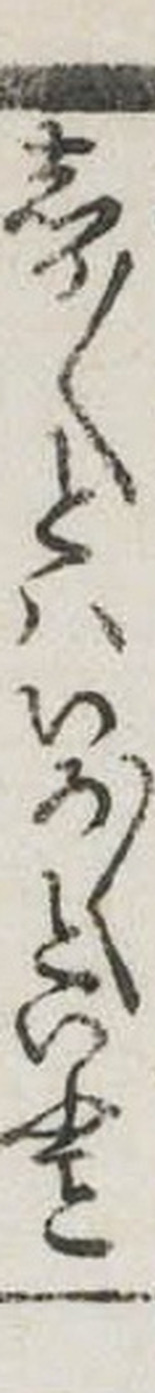しか〳〵とはいろ〳〵といふこと
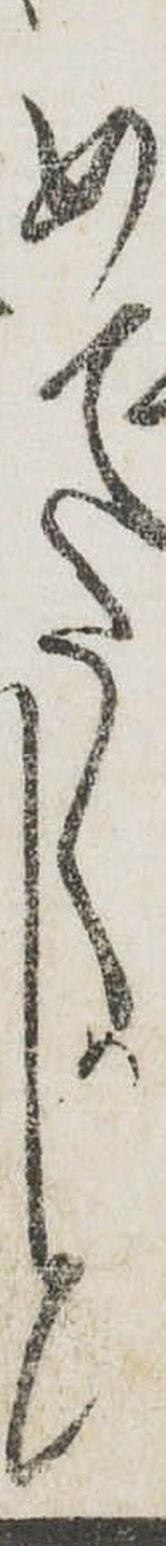めてたくかしく
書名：頭書萬用婦人手紙之文言
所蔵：東京学芸大学教育コンテンツアーカイブ
